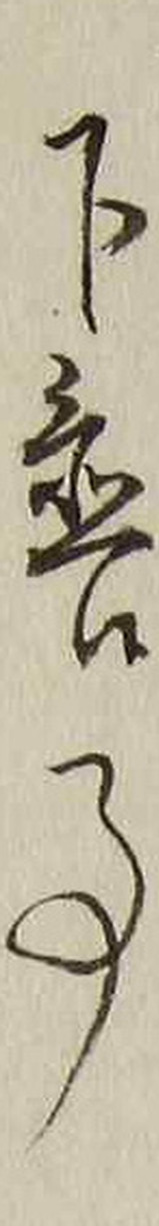下置候事
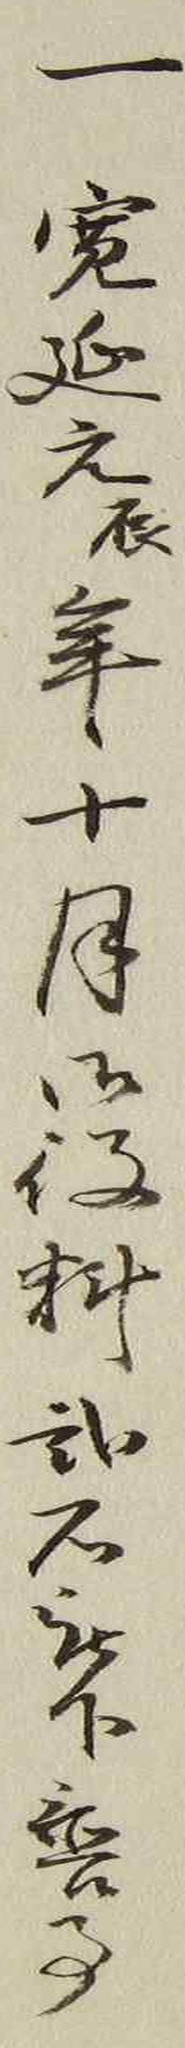一寛延元辰年十月御役料弐石被下置候事
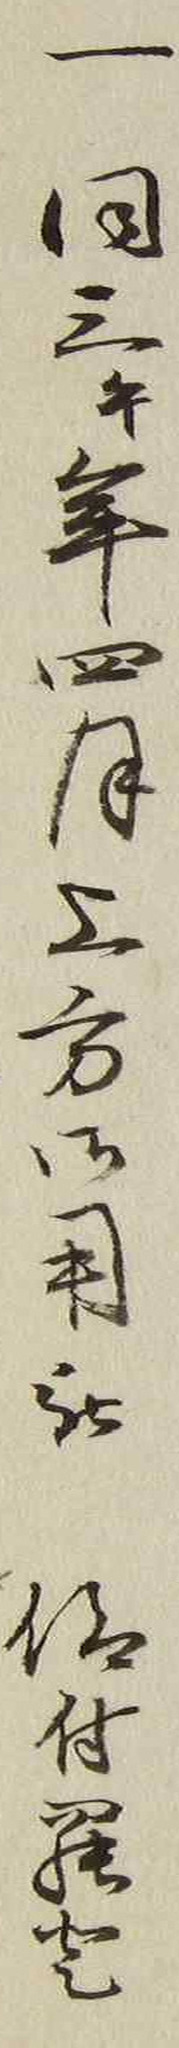一同三午年四月上方御用被仰付罷登
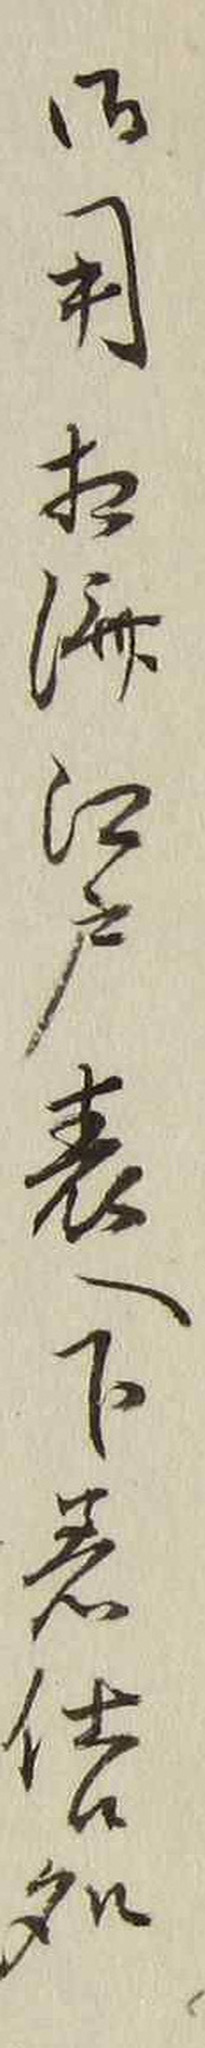御用相済江戸表へ下着仕候処
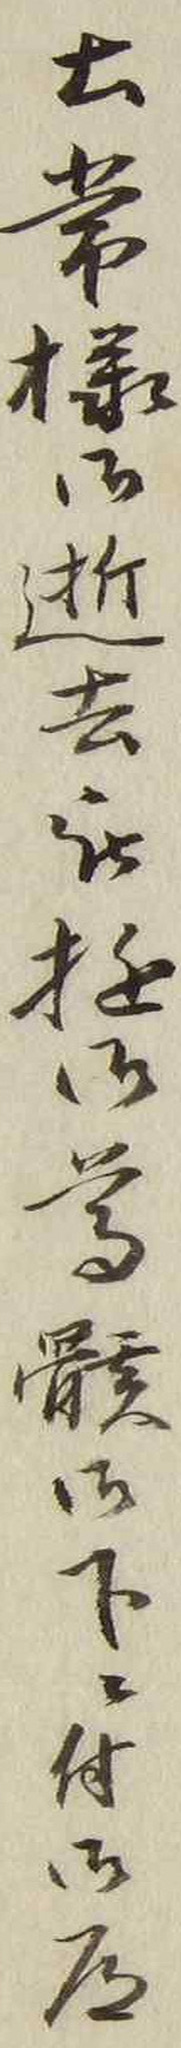土常様御逝去被遊御尊骸御下ニ付御道

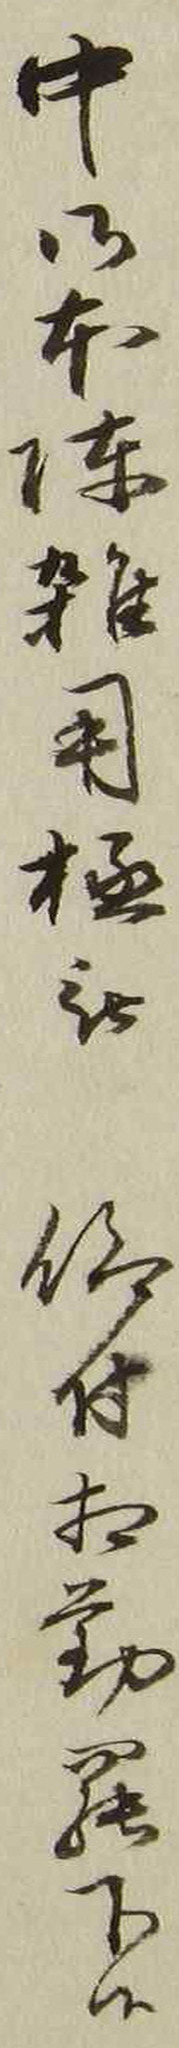中御本陳雑用極被仰付相勤罷下候
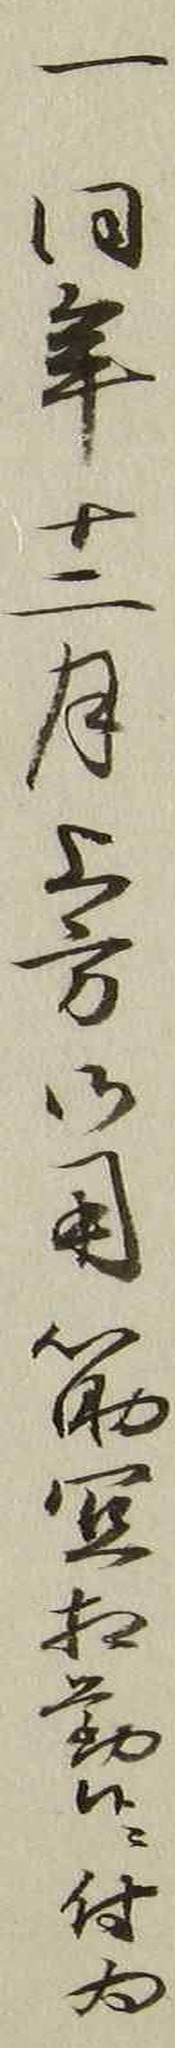一同年十二月上方御用筋宣相勤候ニ付ゐ
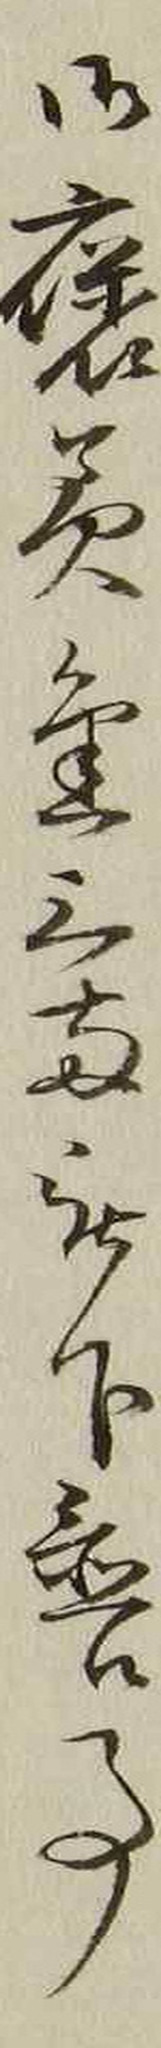御褒美金三両被下置候事
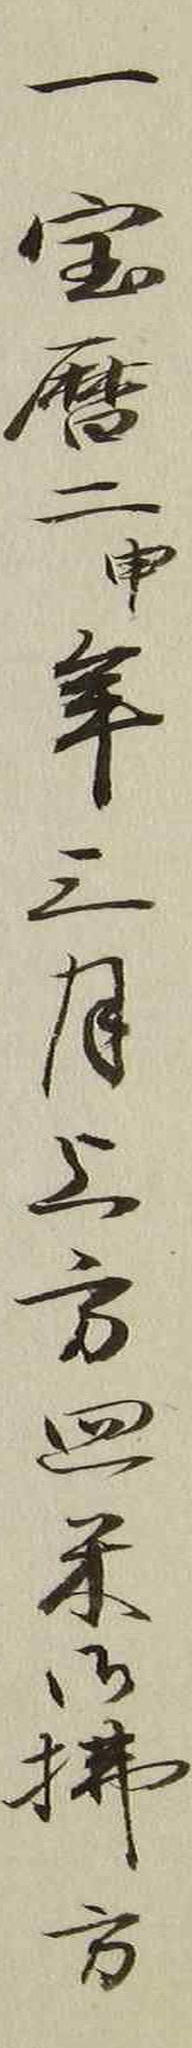一宝暦ニ申年三月上方廻米御払方
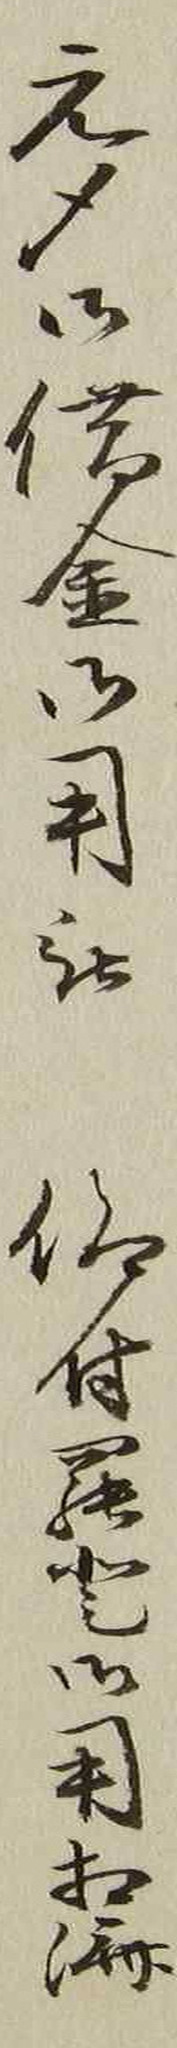元〆御借金御用被仰付罷登御用相済
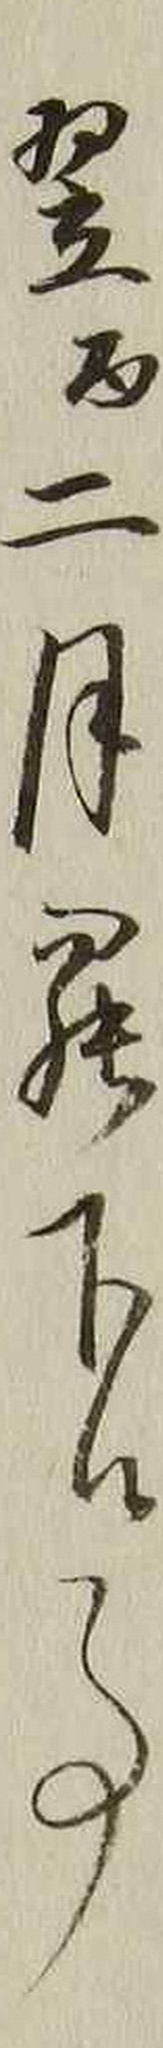翌酉二月罷下候事
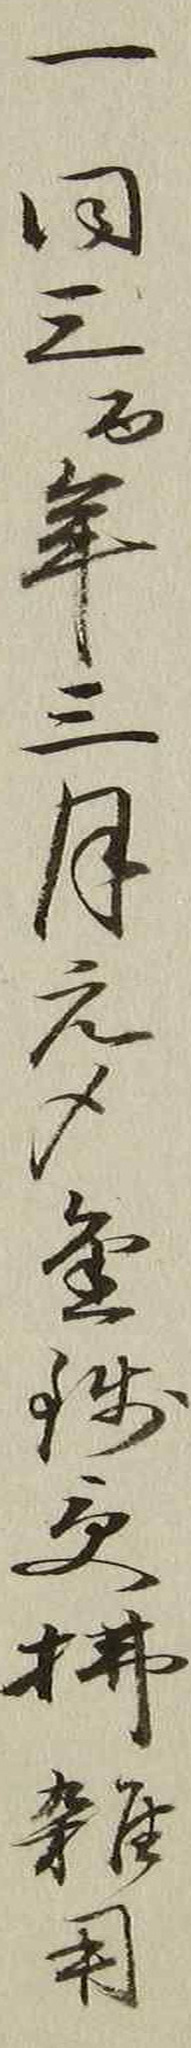一同三酉年三月元締勤残受払雑用
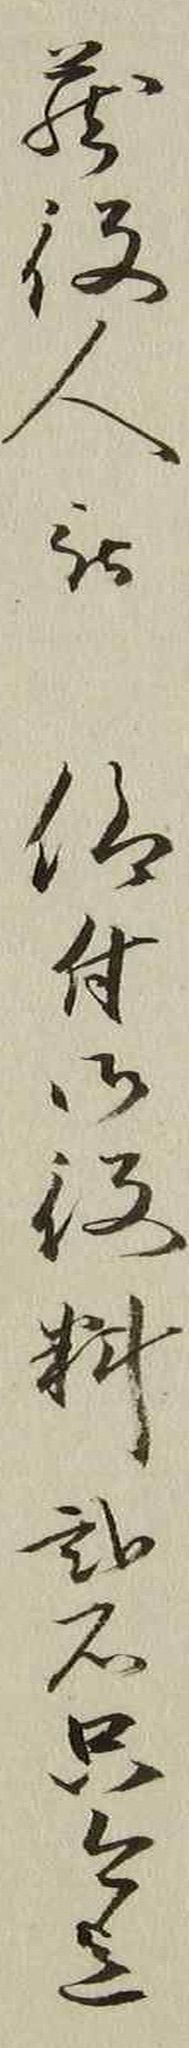蔵役人被仰付御役料弐石只今迄
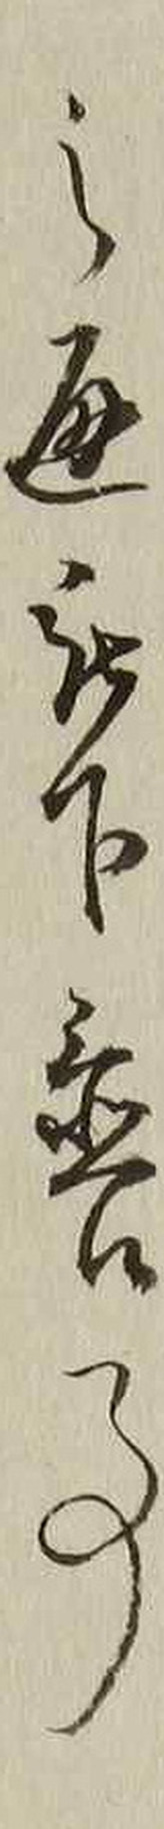之通被下置候事
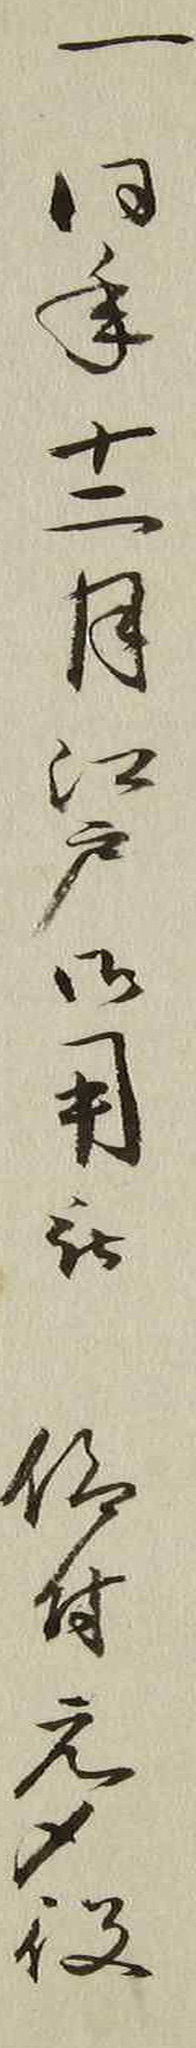一同年十二月江戸御用被仰付元〆役
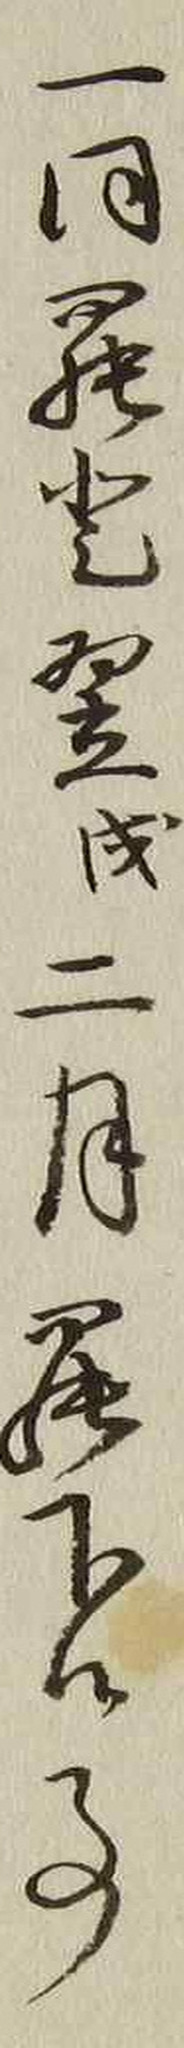一同罷登翌戌二月罷下候事
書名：諸士系譜　巻之114　か之部22
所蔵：会津若松市立会津図書館
